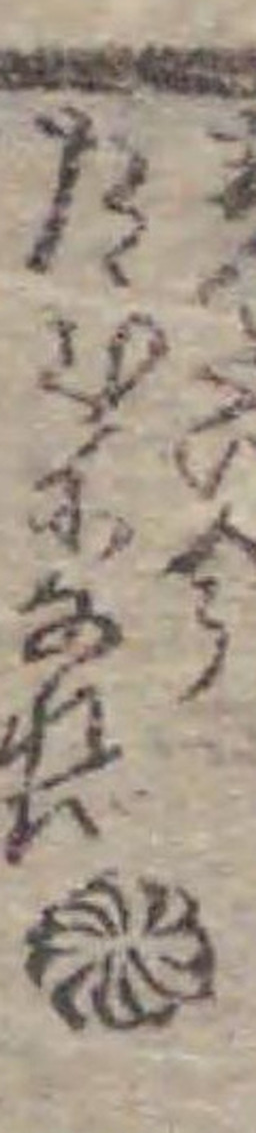たゝむ所なれば
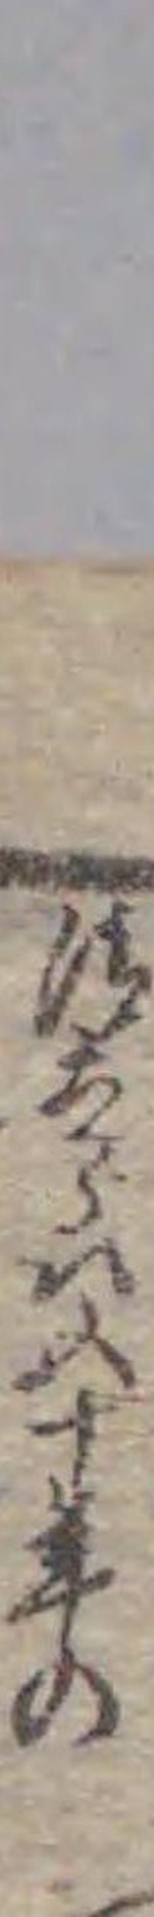清太郎は五十年の
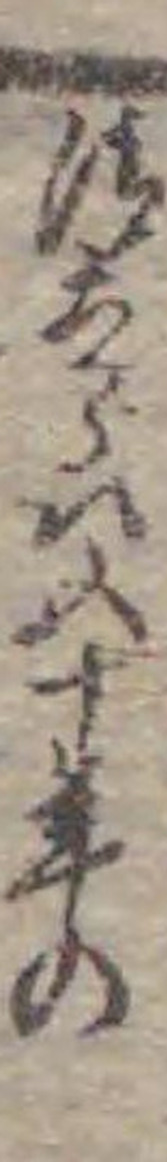清太郎は五十年の
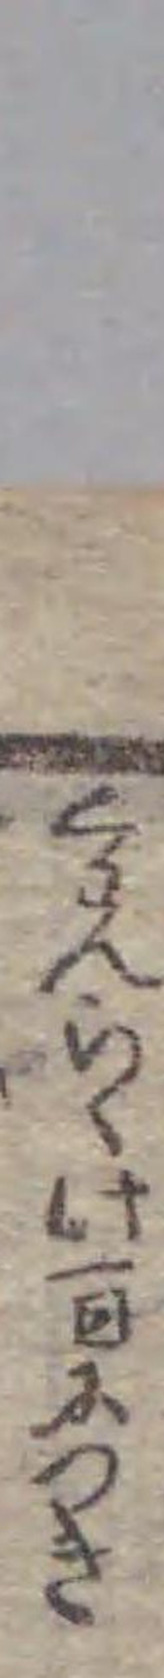くわんらく此一日につき
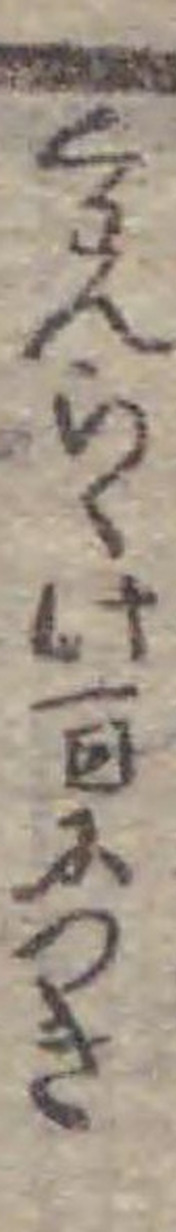くわんらく此一日につき
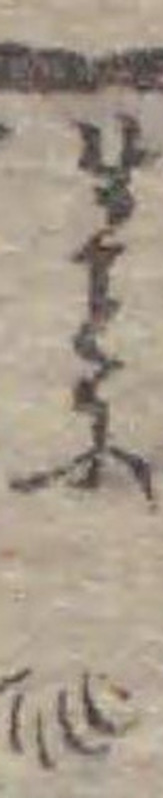まことに
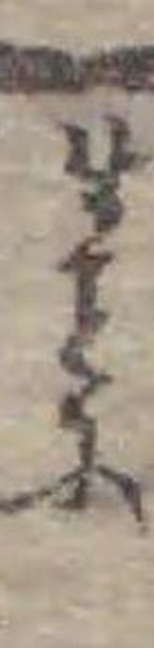まことに
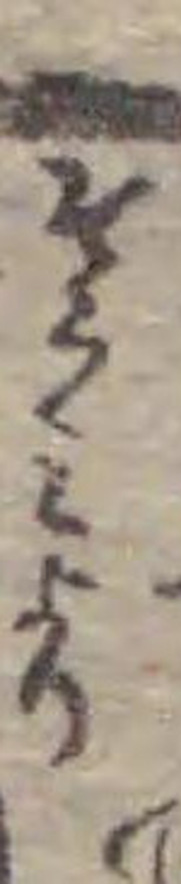そうみより
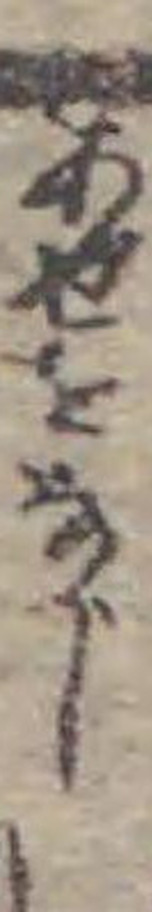あせをながし
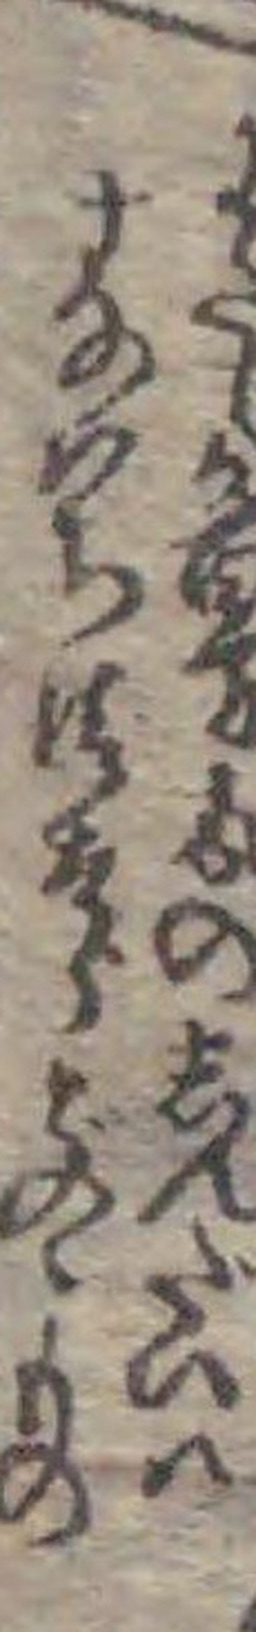すなはち清太郎どのゝもの
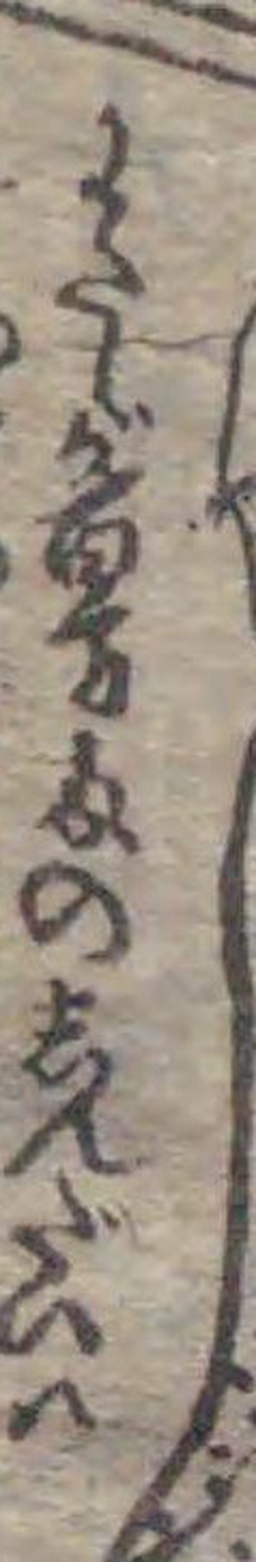わたしが百万両のしんだいは
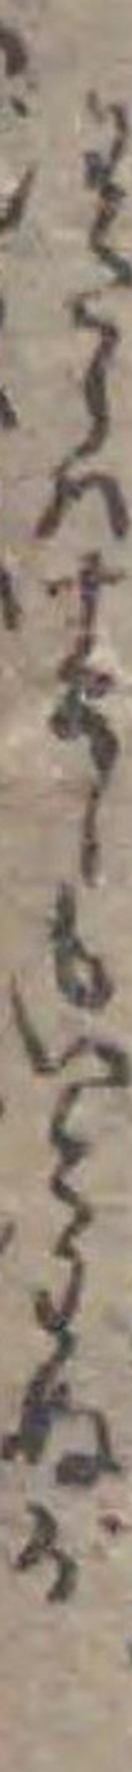わたしはすこしもいとわぬが
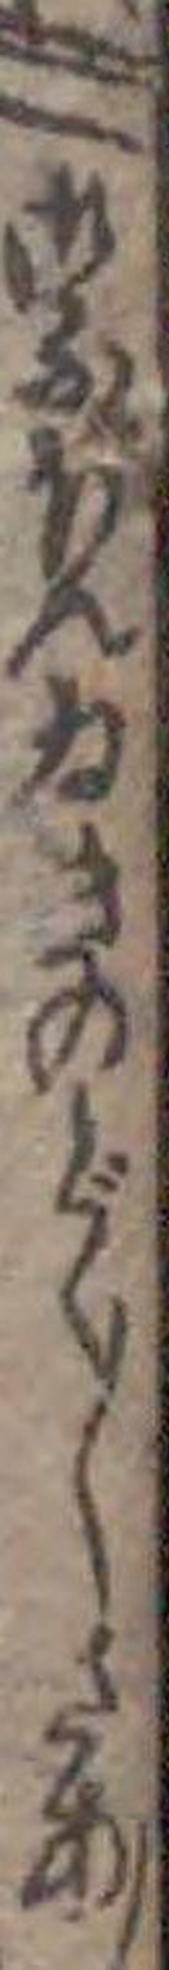御ふほんゐきのどく〳〵さあ〳〵
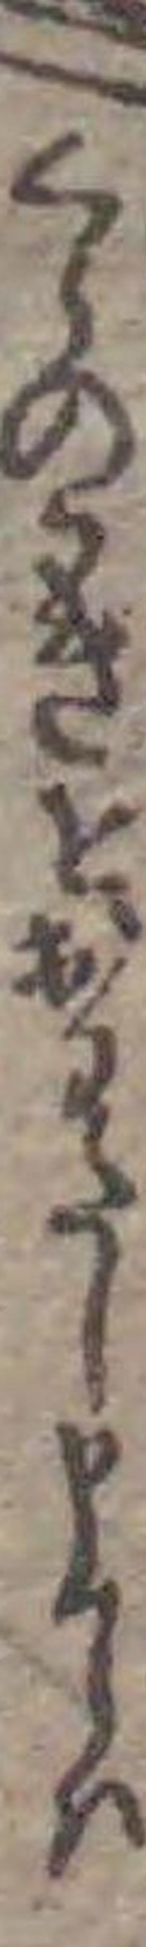くらのかきをおわたし申ては
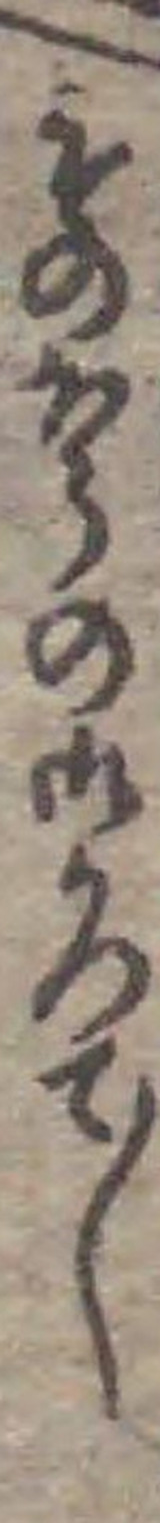そのほうの御かつて〳〵
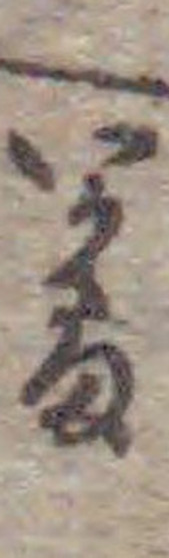いかさま
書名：見徳一炊夢 : 3巻
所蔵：国立国会図書館 National Diet Library, JAPAN
